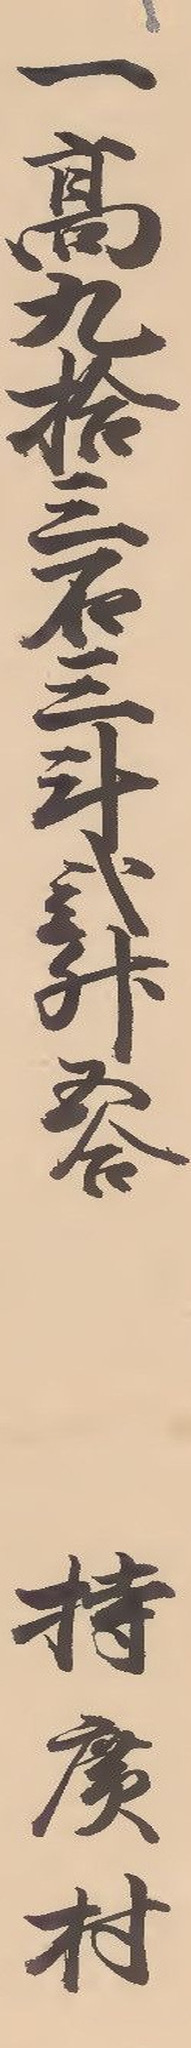一高九拾三石三斗弐升五合持広村
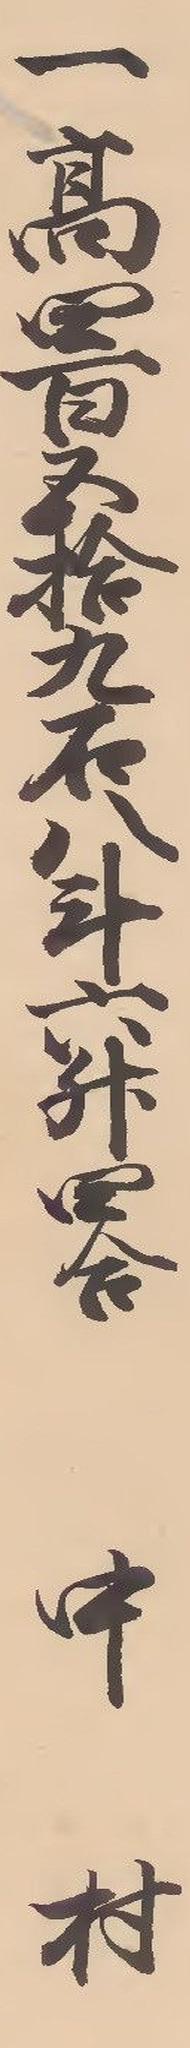一高四百五拾九石八斗六升四合中村

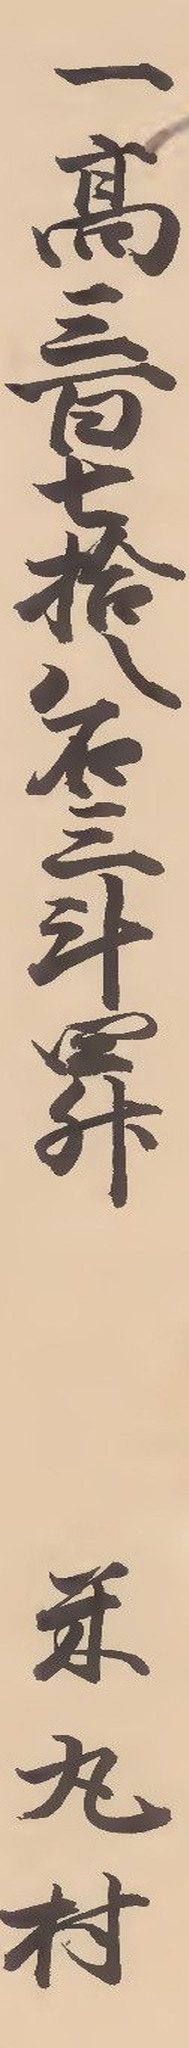一高三百七拾八石三斗四升米丸村
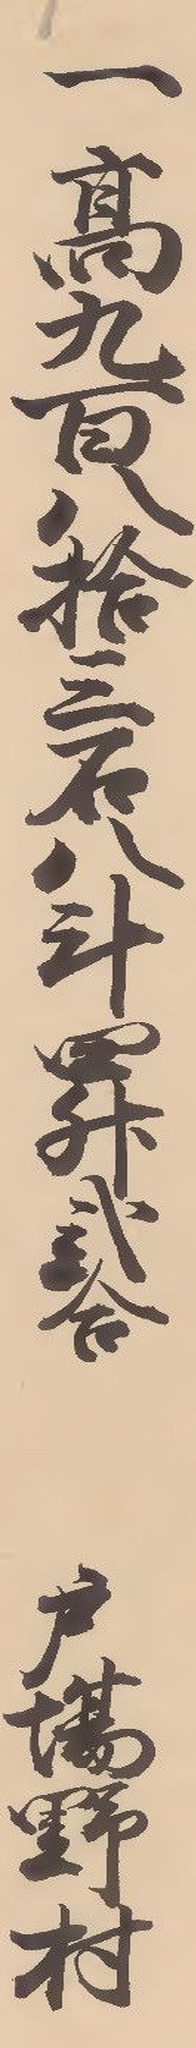一高九百八拾三石八斗四升弐合戸場野村
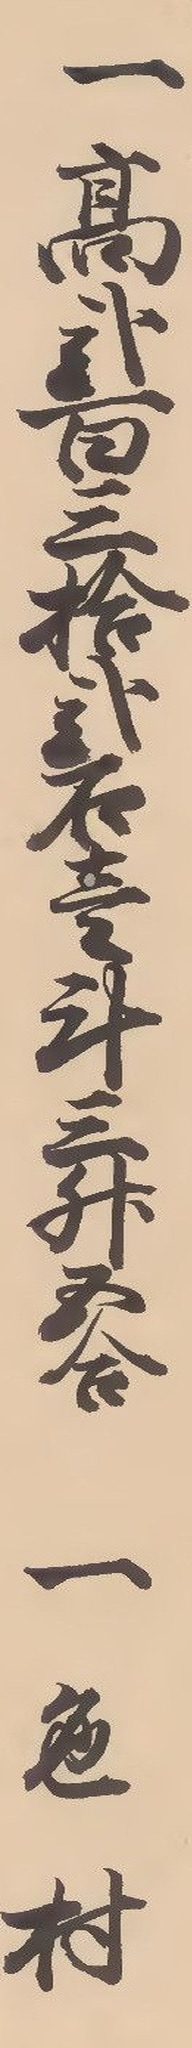一高弐百三拾弐石壱斗三升五合一色村
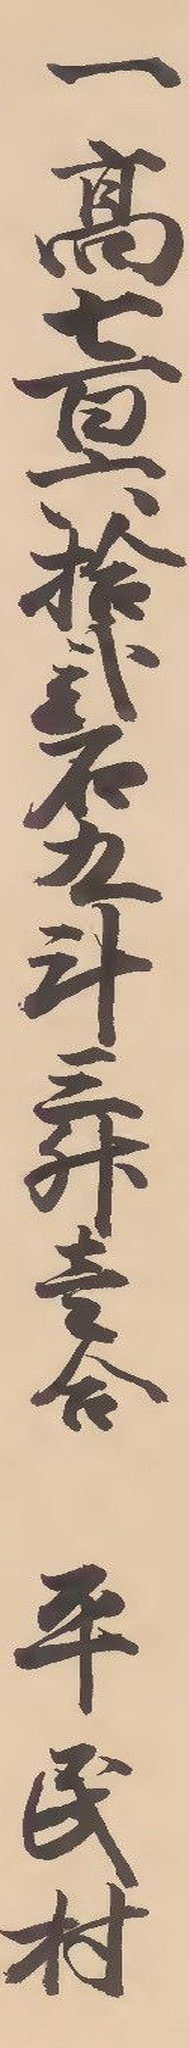一高七百六拾弐石九斗三升壱合平民村
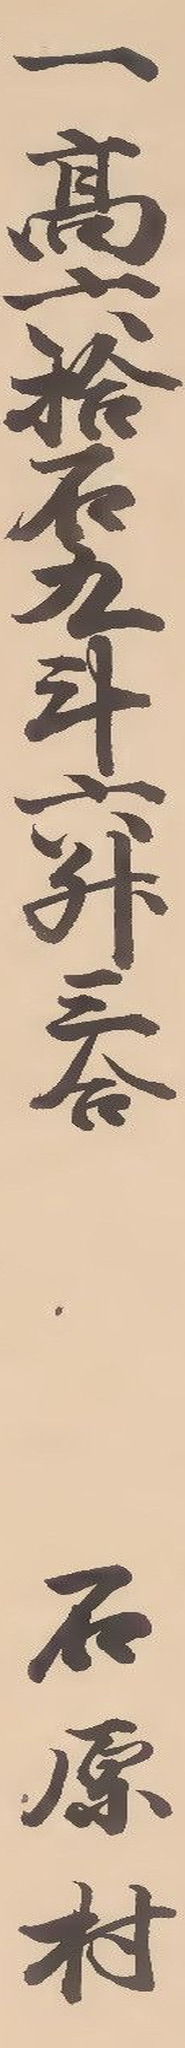一高六拾石九斗六升三合石原村
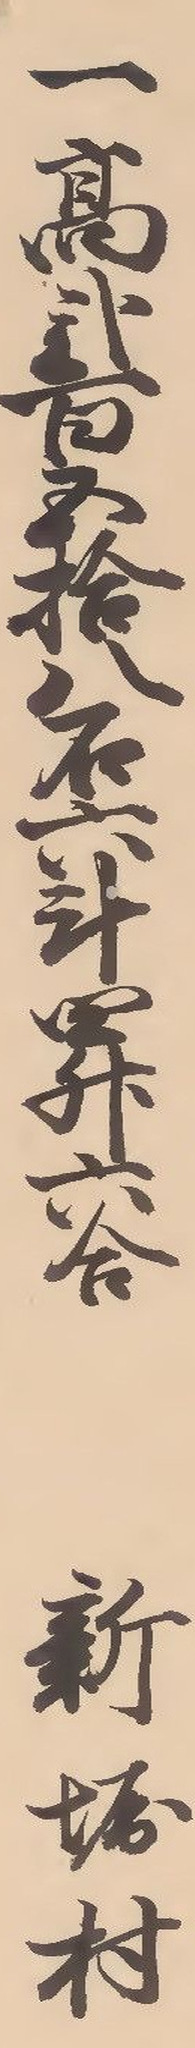一高弐百五拾八石六斗四升六合新堀村
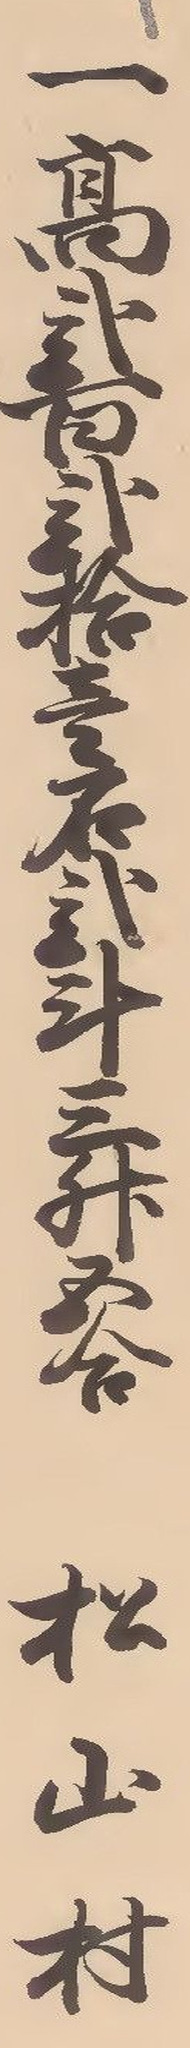一高弐百弐拾壱石弐斗三升五合松山村
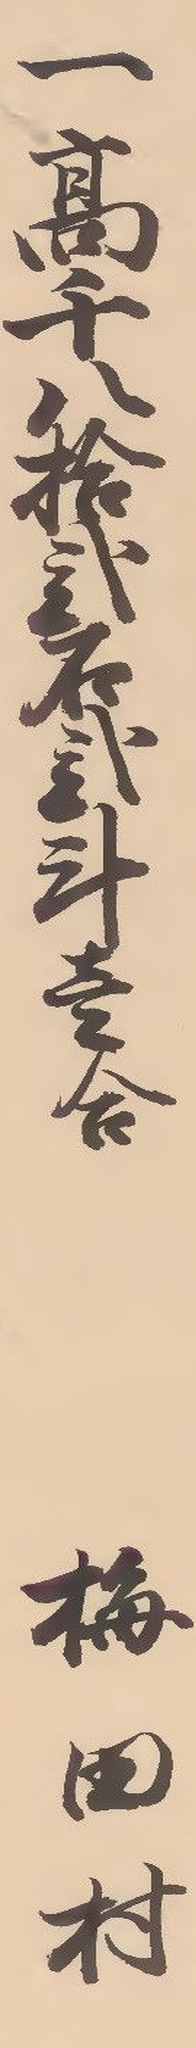一高千八拾弐石弐斗壱合梅田村

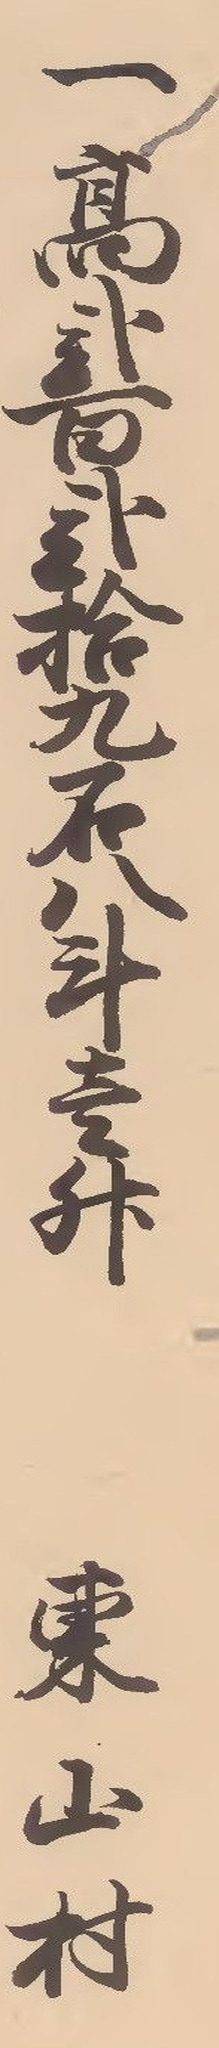一高弐百弐拾九石八斗壱升東山村
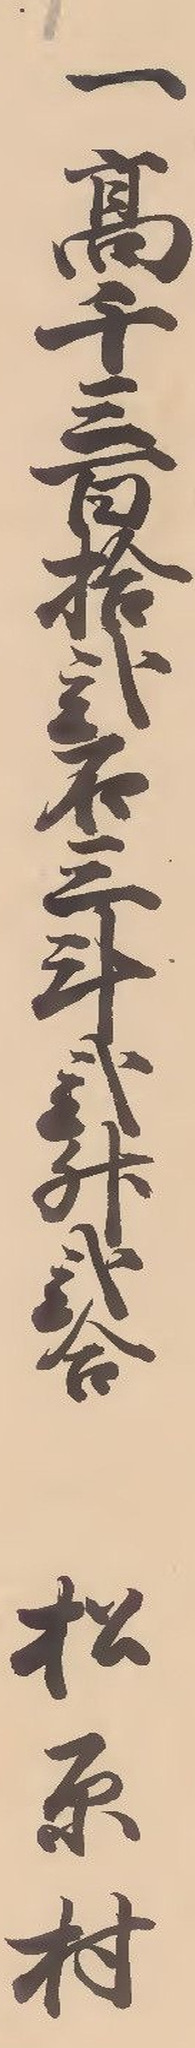一高千三百拾弐石三斗弐升弐合松原村
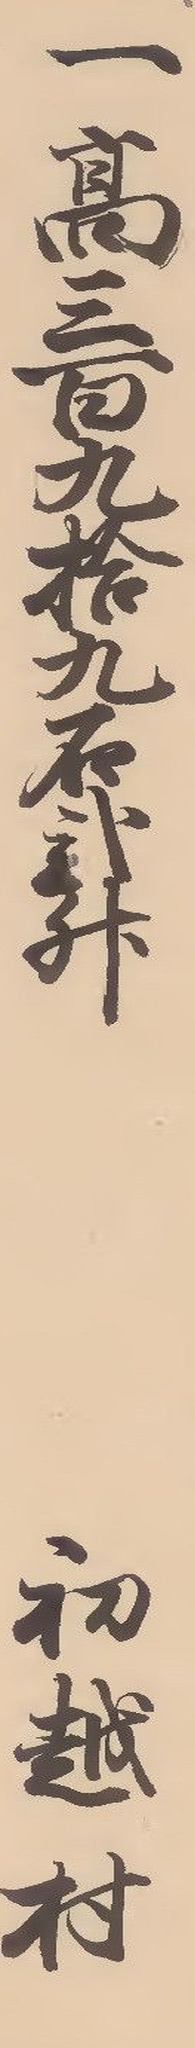一高三百九拾九石弐升初越村
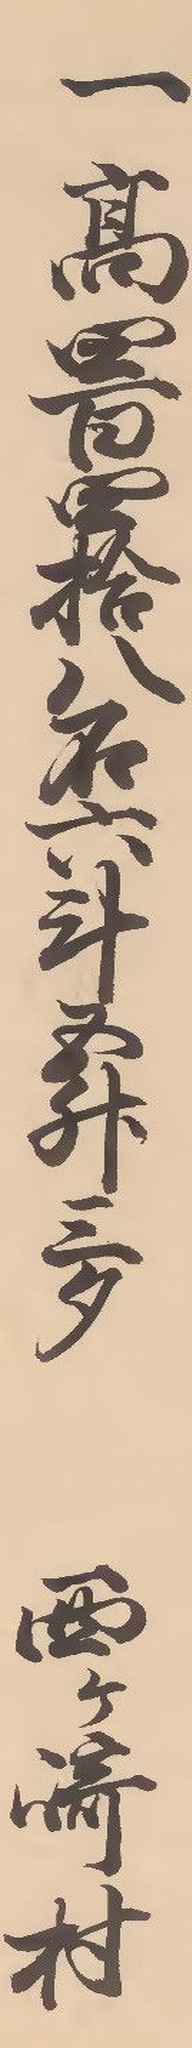一高四百四拾八石六斗五升三勺西ヶ崎村
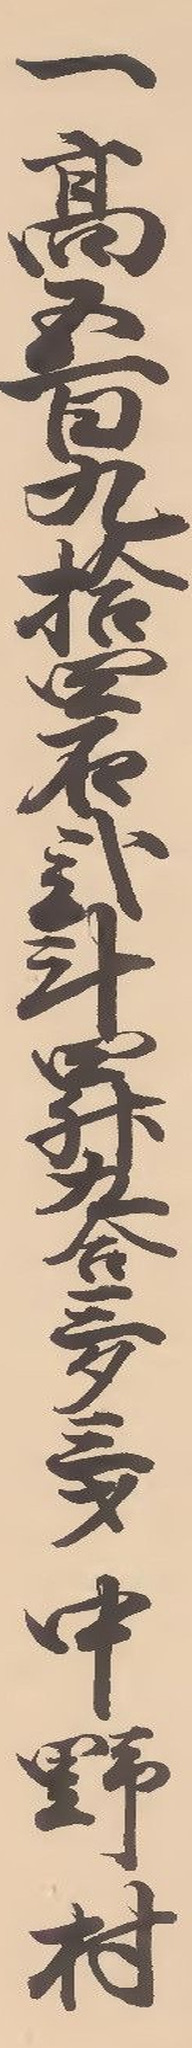一高五百九拾四石弐斗四升九合三勺三才中野村
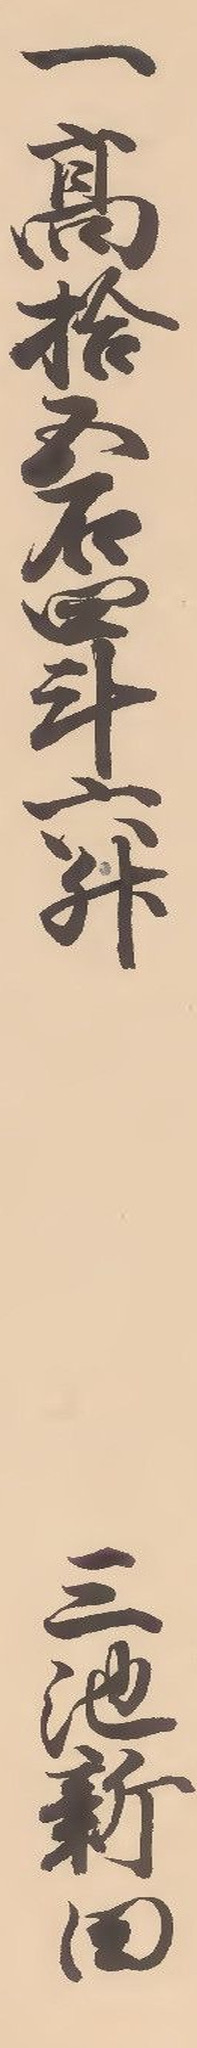一高拾五石四斗六升三池新田
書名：遠江国郷帳
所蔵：国立公文書館 National Archives of Japan
